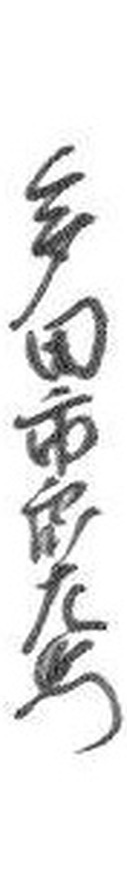多田市郎左衛門
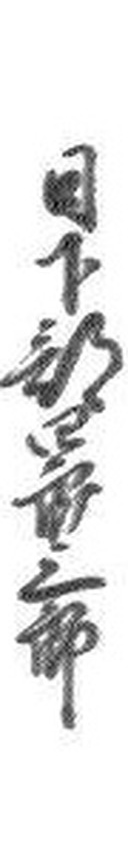日下部四郎三郎
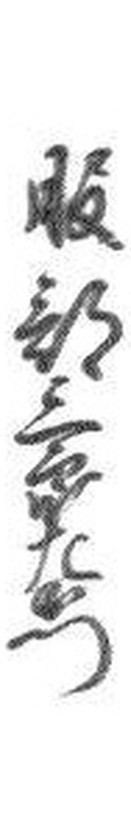服部三郎左衛門
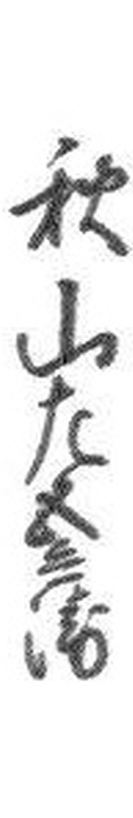秋山左五兵衛
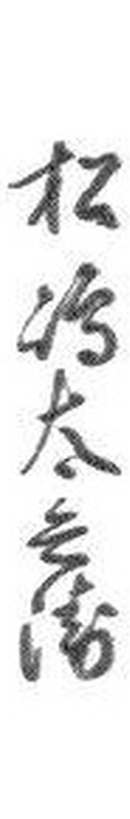松島太兵衛
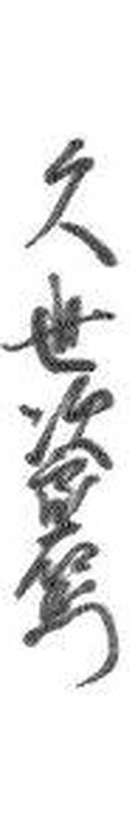久世次郎右衛門
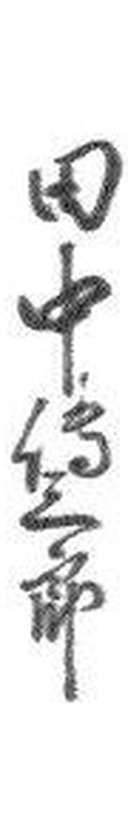田中伝三郎
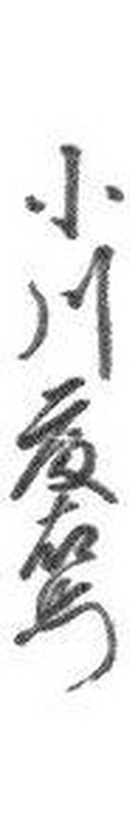小川藤右衛門
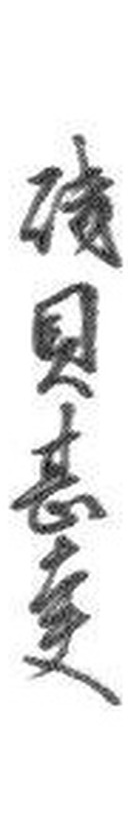磯貝甚太夫
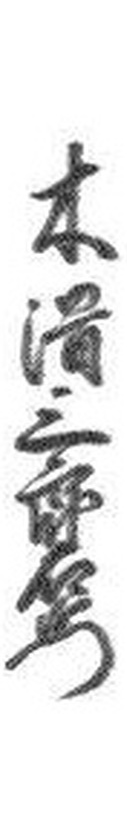木滑三郎右衛門

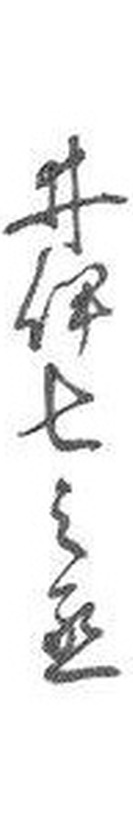井伊七之丞
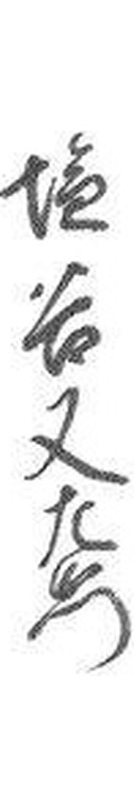塩谷又左衛門
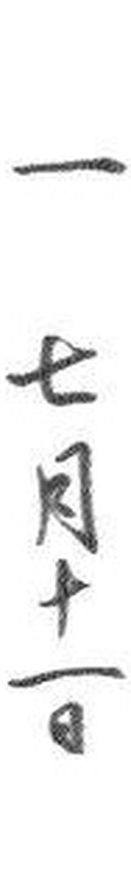一七月十一日
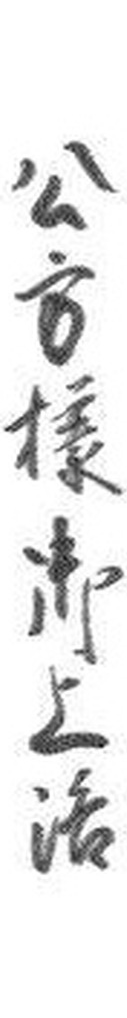公方様御上洛
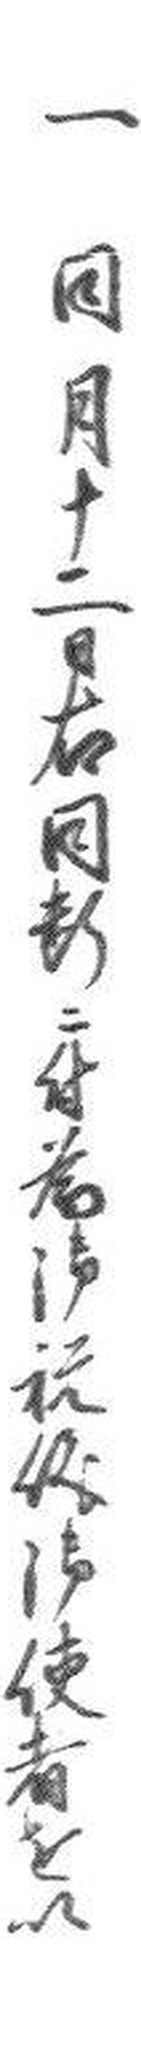一同月十二日右同断ニ付為御祝儀御使者を以
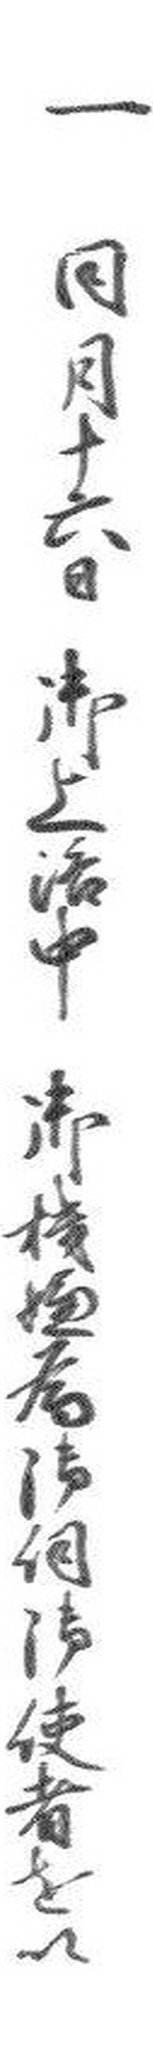一同月十六日御上洛中御機嫌為御伺御使者を以
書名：家譜 四 忠昌公 従寛永七年到正保四年
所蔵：福井県文書館 Fukui Prefectural Archives
